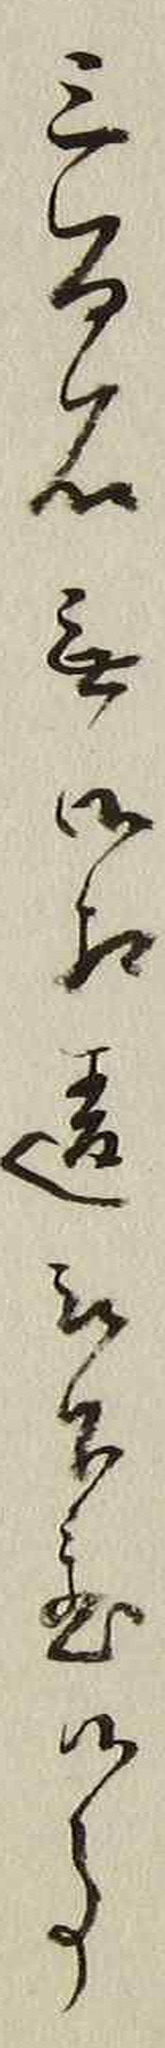三百石無御相違被下置候事
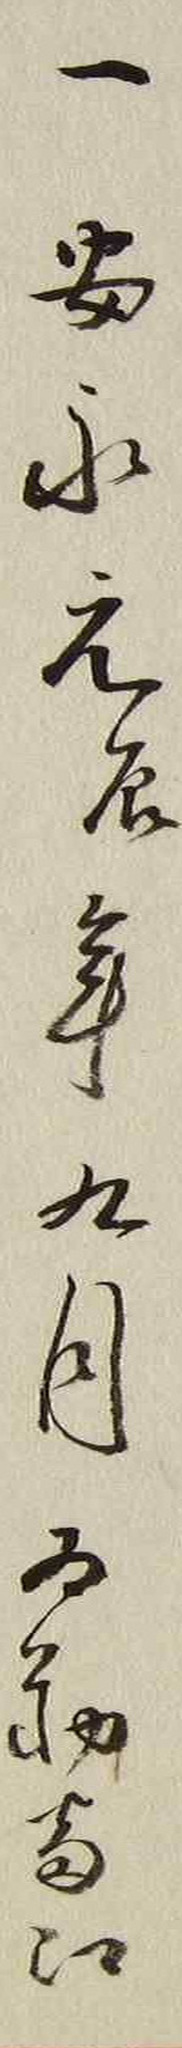一安永元辰年九月為勤番江
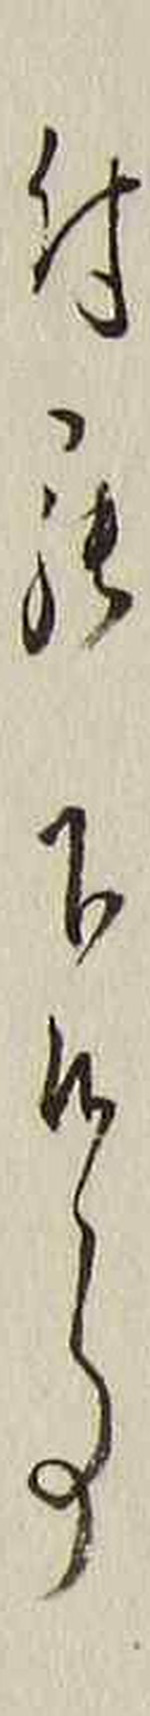付罷下候事
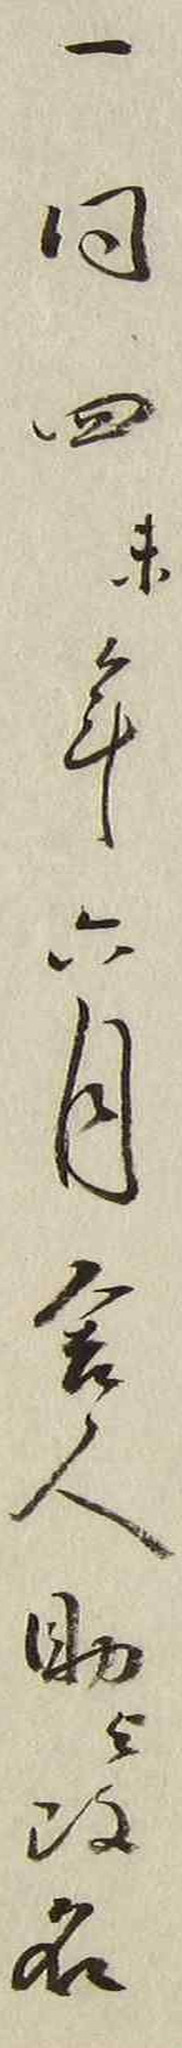一同四未年六月舎人助と改名

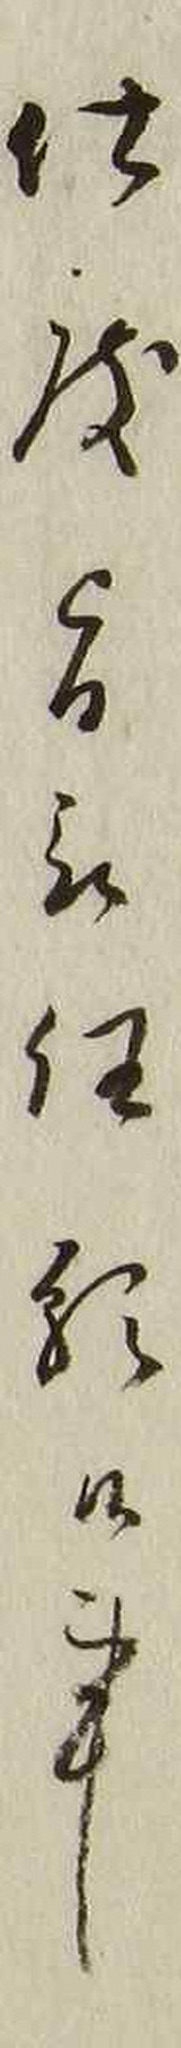仕度旨任願候事
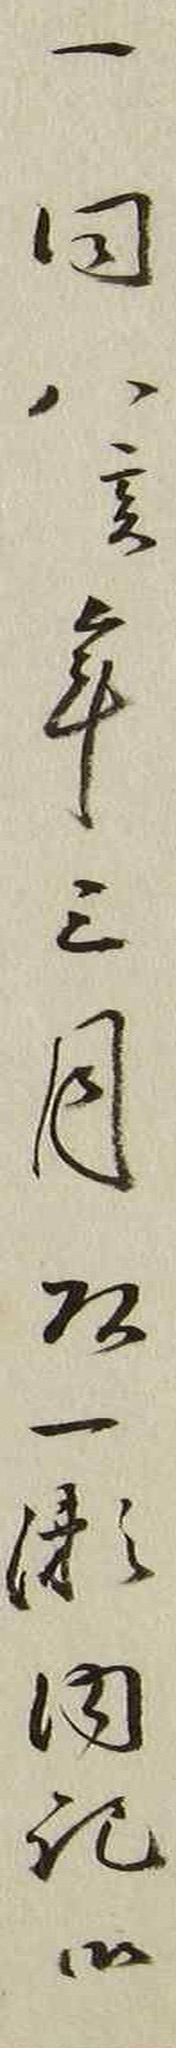一同八亥年三月頭一瀬内記御
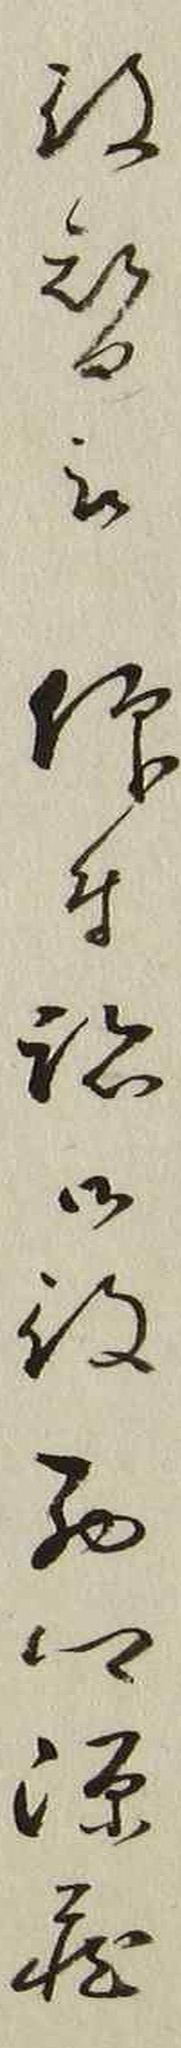役替被仰付跡御役西郷源蔵
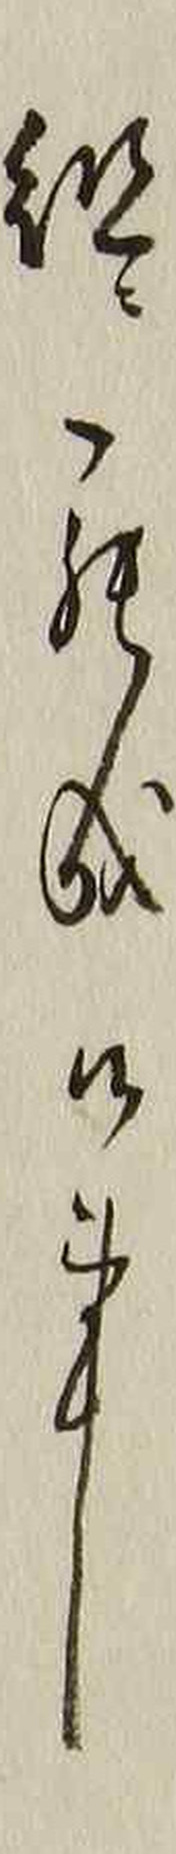組に罷成候事
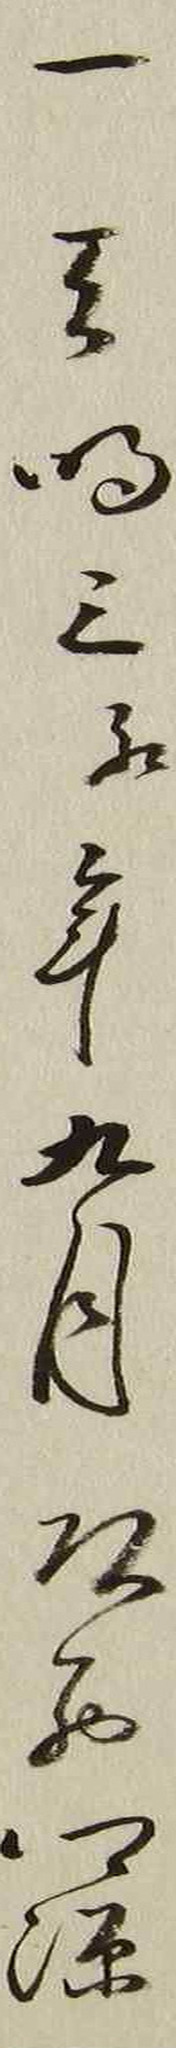一天明三卯年九月頭西郷源
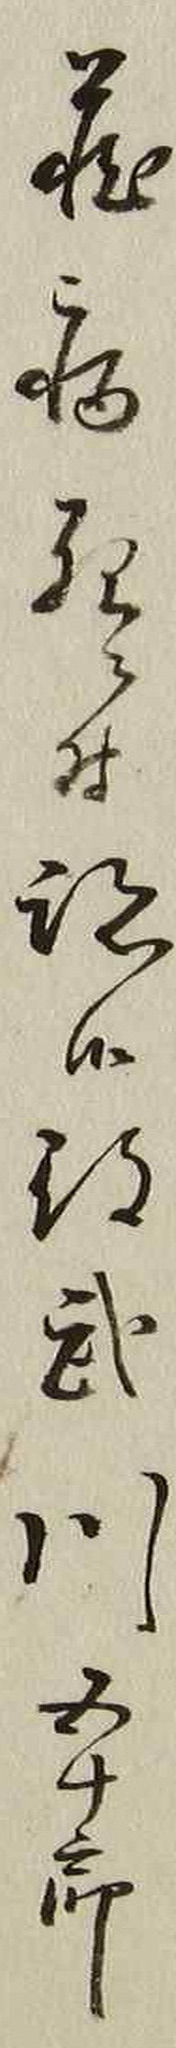蔵病死に付跡御役武川五十郎
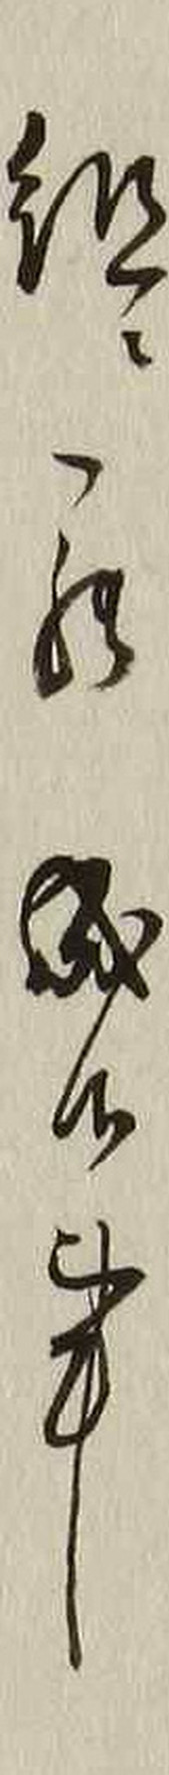組に罷成候事
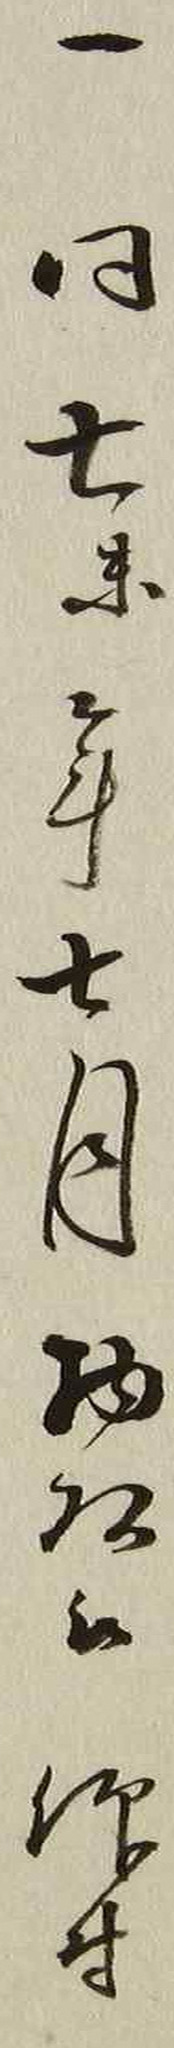一同七未事七月物頭被仰付
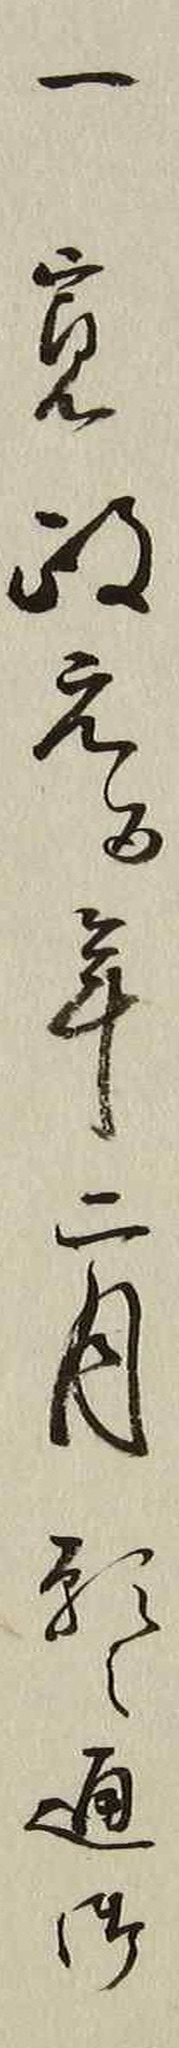一寛政元酉年二月願之通御
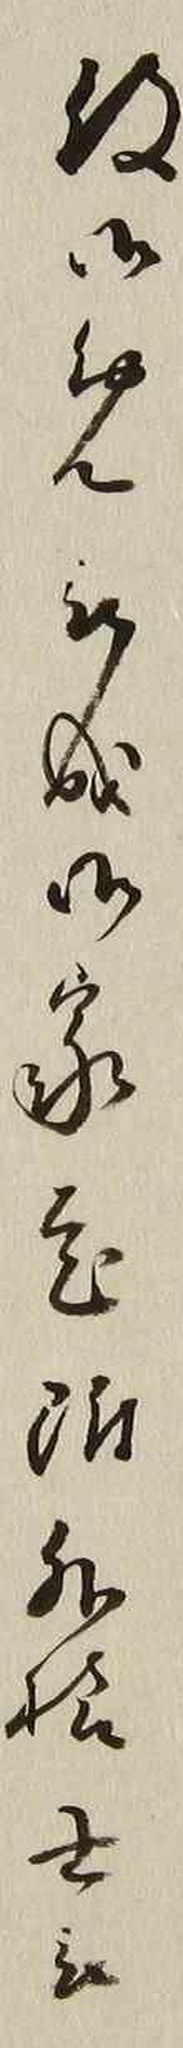御役御免被成御家老附外様士被
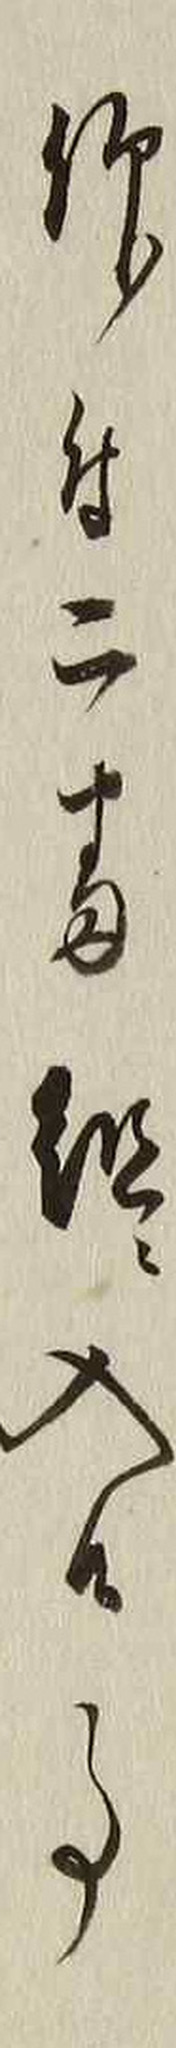仰付二番組に入候事
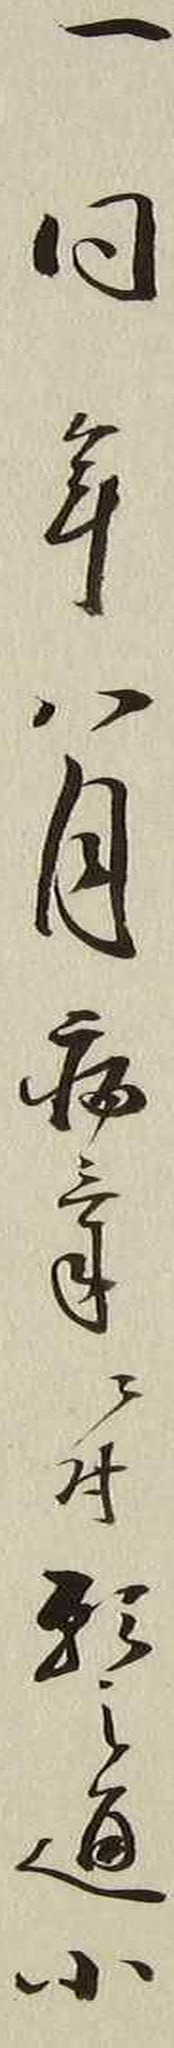一同年八月病気に付願之通小
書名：諸士系譜　巻之159　な之部1
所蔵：会津若松市立会津図書館
